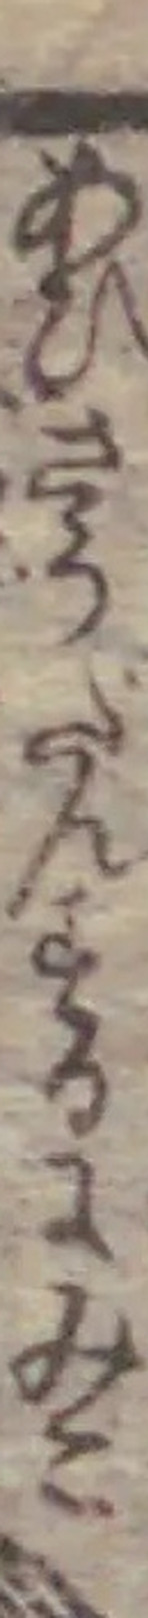あひさうだんするにみこ
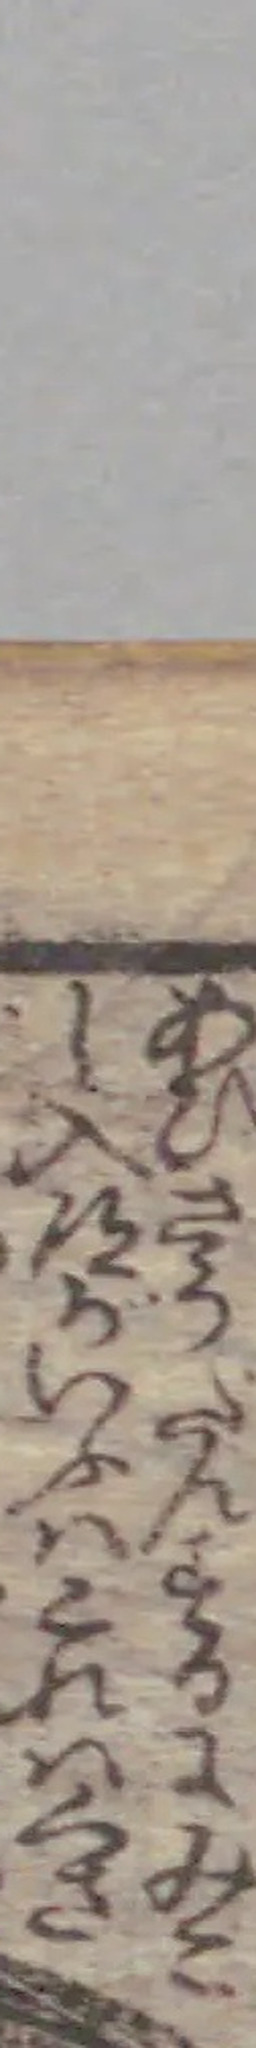し入道がいふはこれはくさ
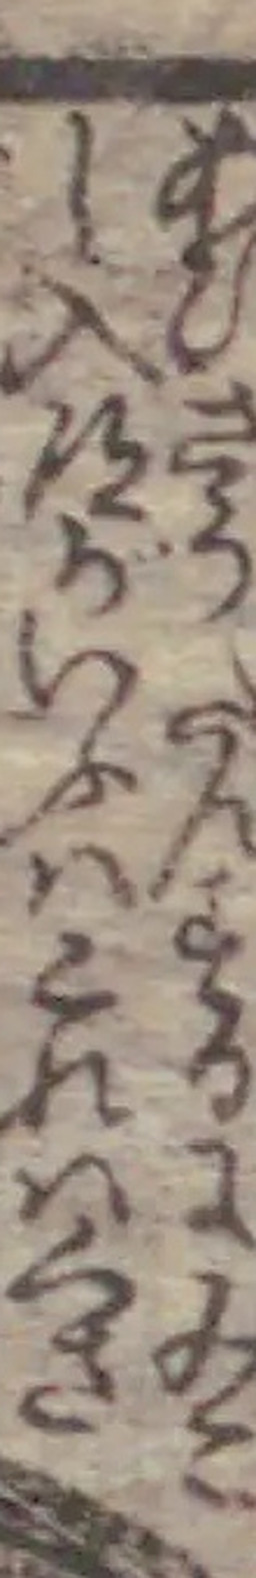し入道がいふはこれはくさ
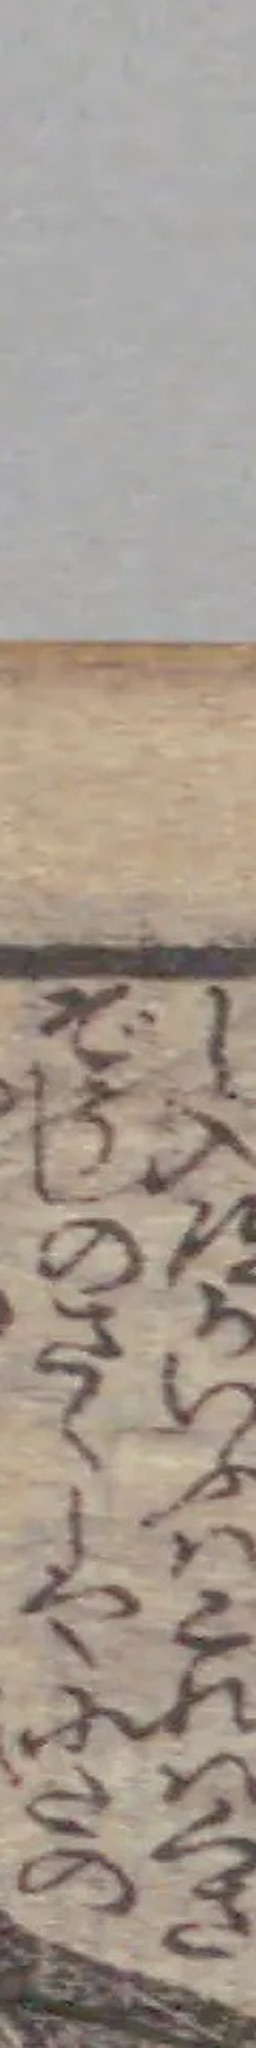ぞうしのさくしやにたの
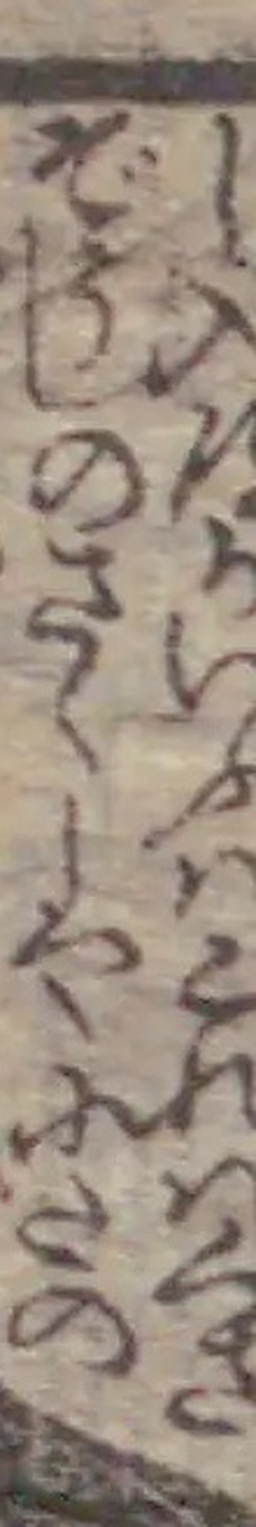ぞうしのさくしやにたの
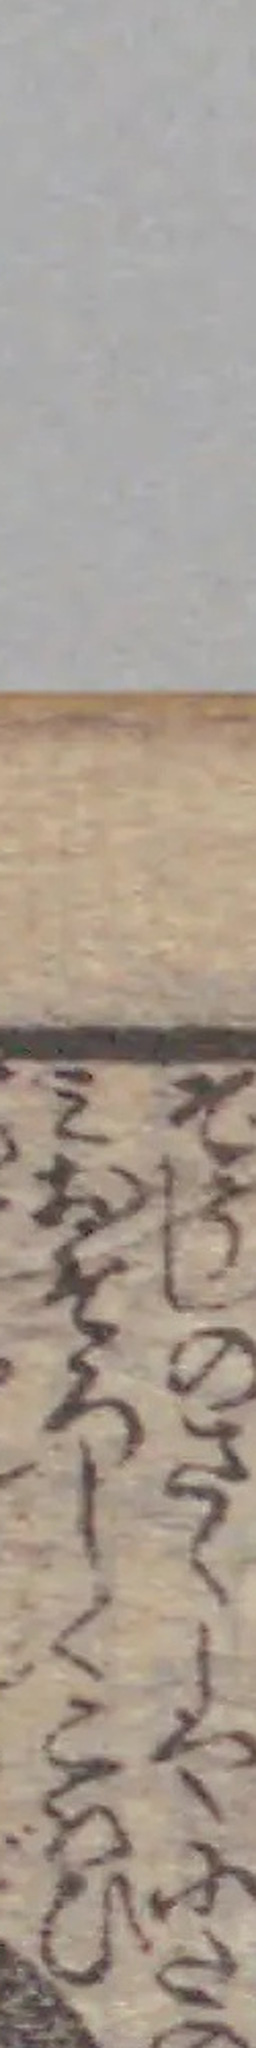みおそろしくこはひ
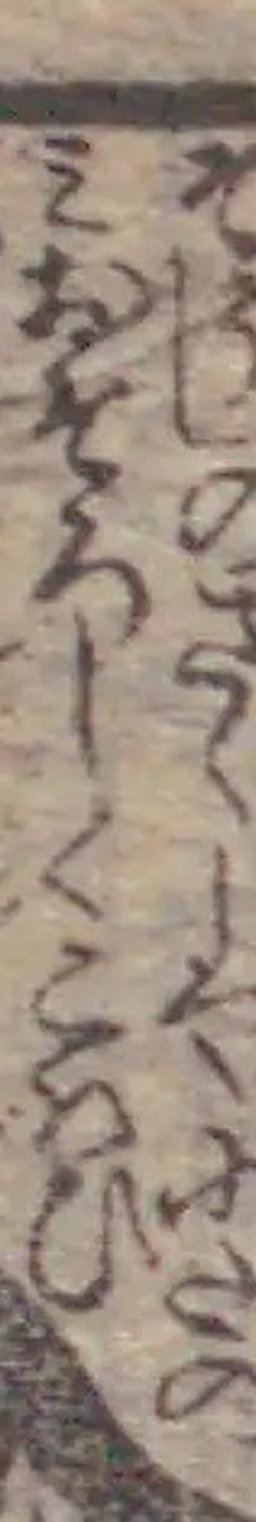みおそろしくこはひ
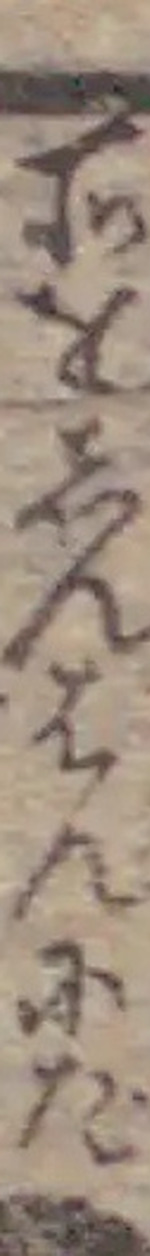所をしんばんにだ
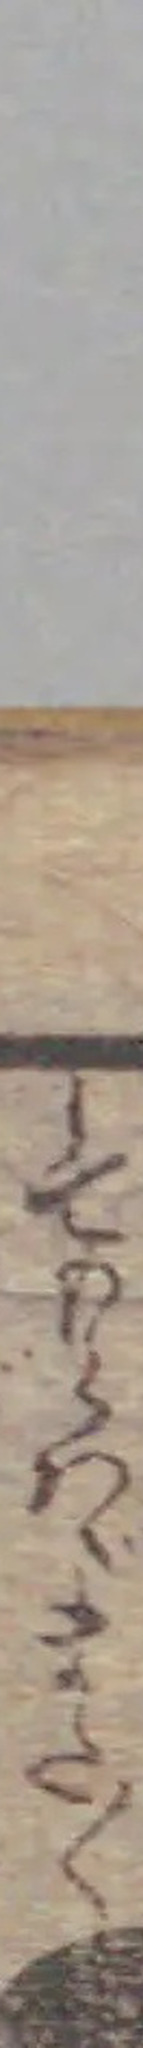してもらはゞまた〳〵
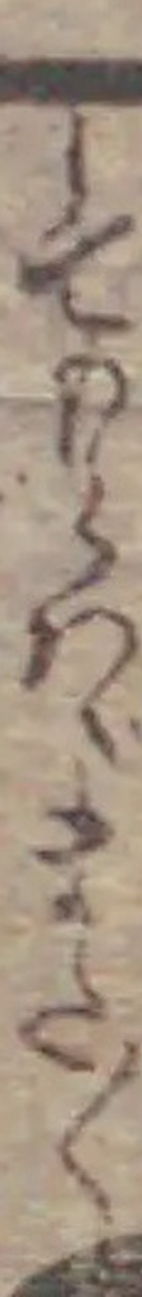してもらはゞまた〳〵
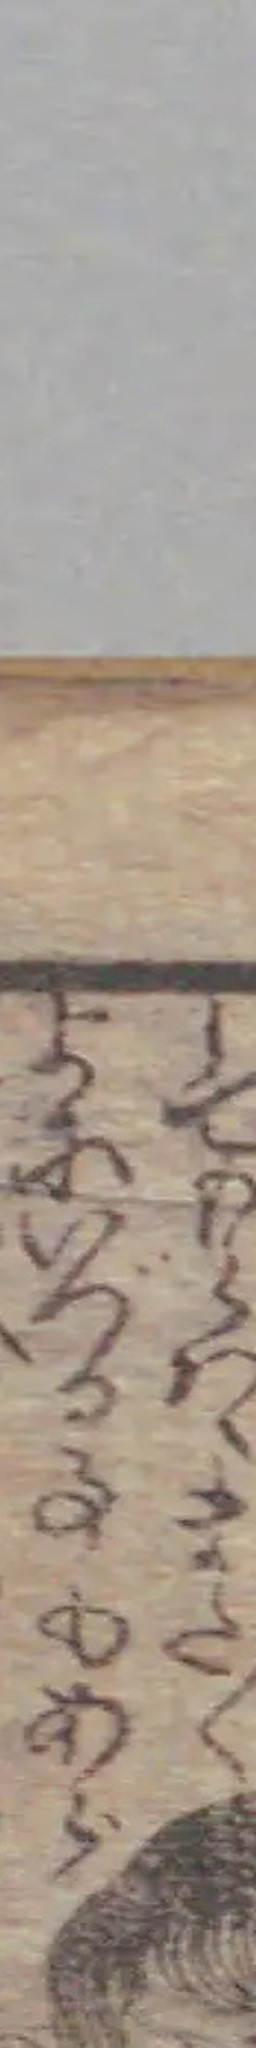よにいづる事もあら
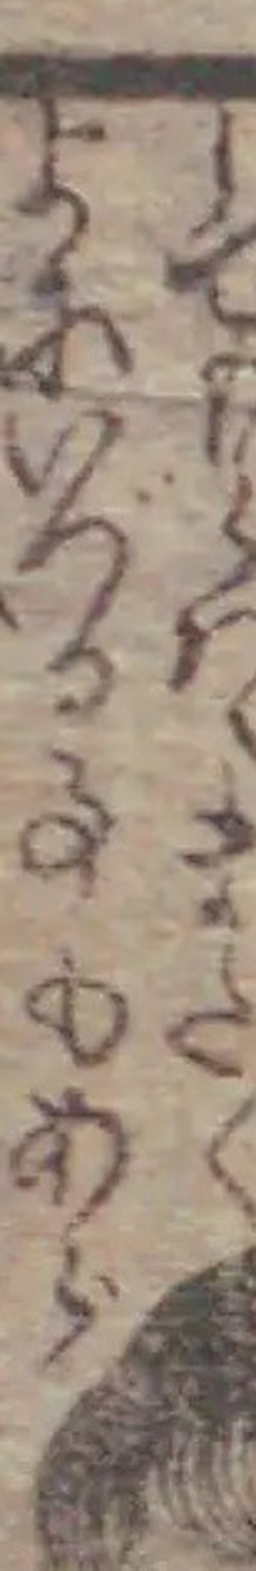よにいづる事もあら
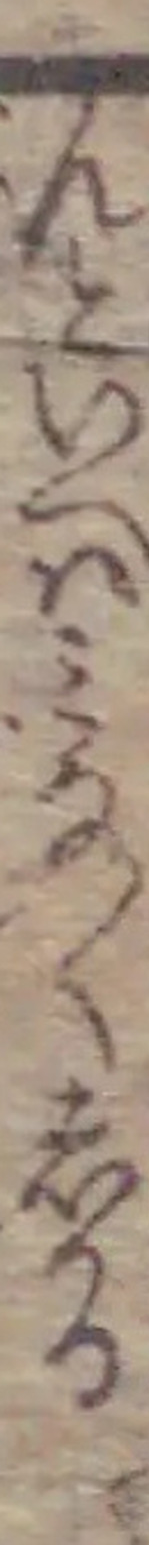んといへはみな〳〵しかる
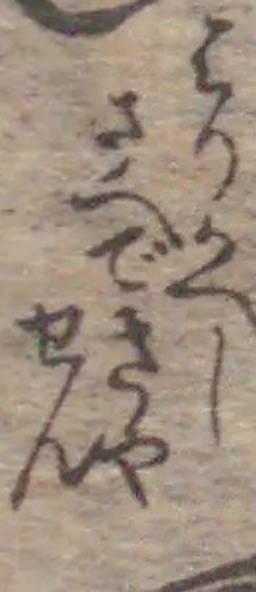さへできや
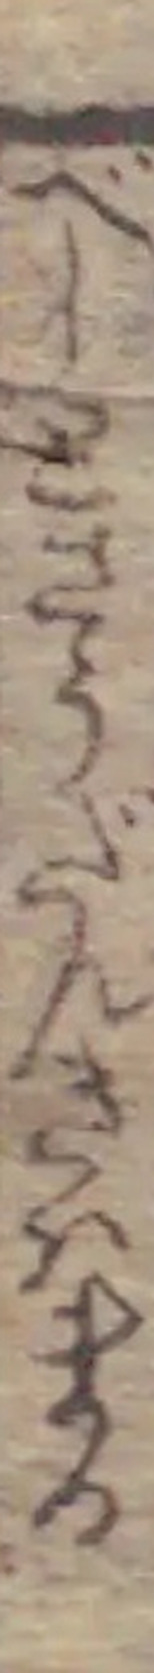べしとさうだんきはまる

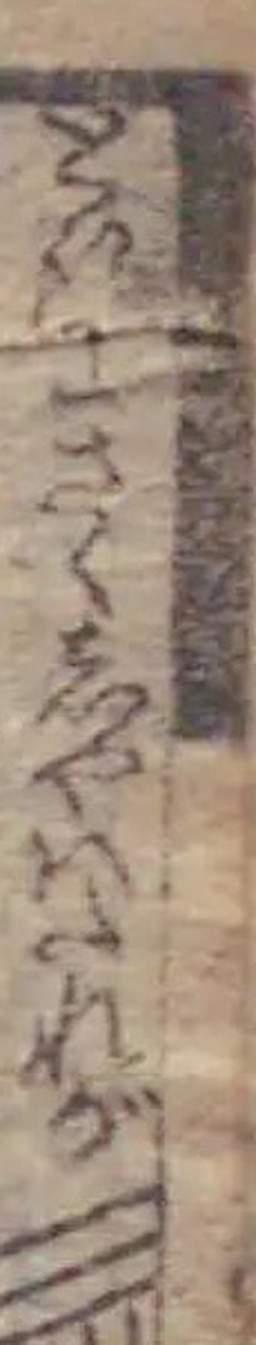ときにさくしやはたれが
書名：化物大閉口 2巻
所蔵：国立国会図書館 National Diet Library, JAPAN
